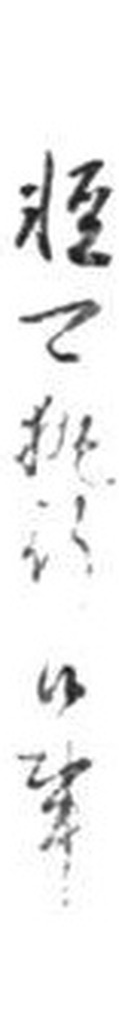軽可執行候事
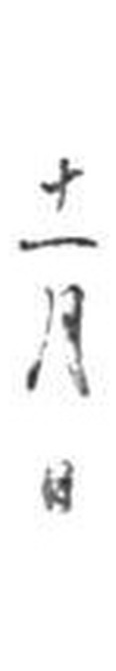十一月日
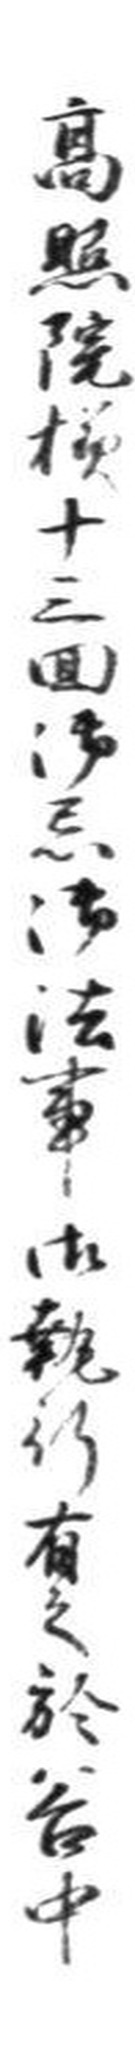高照院様十三回御忌御法事御執行有之於谷中
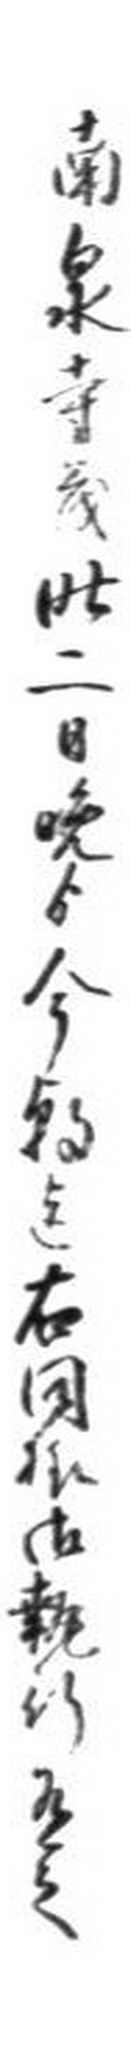南泉寺も昨二日晩ゟ今朝迄右同様御執行有之
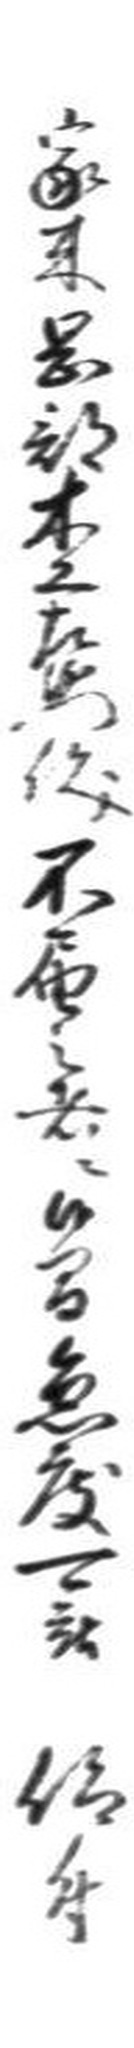家来岡部木工左衛門儀不届之者ニ候相間急度可被仰付
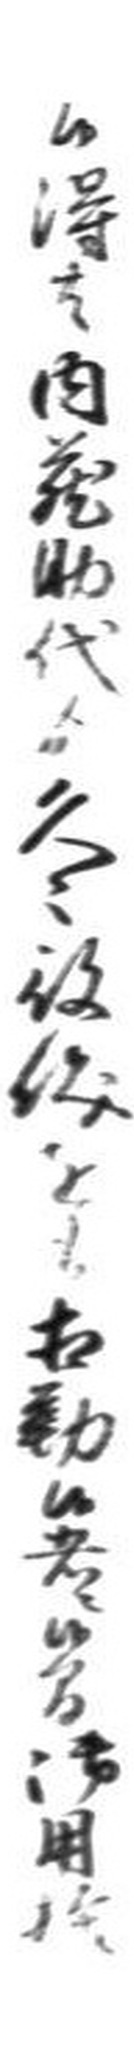候得共内蔵助代ゟ久々役儀をも相勤候者ニ候間御用捨
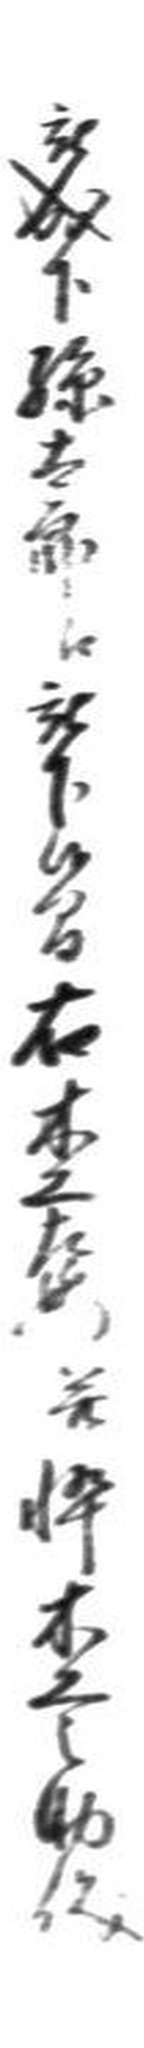被成下孫太郎江被下候間右木工左衛門并倅木工之助儀
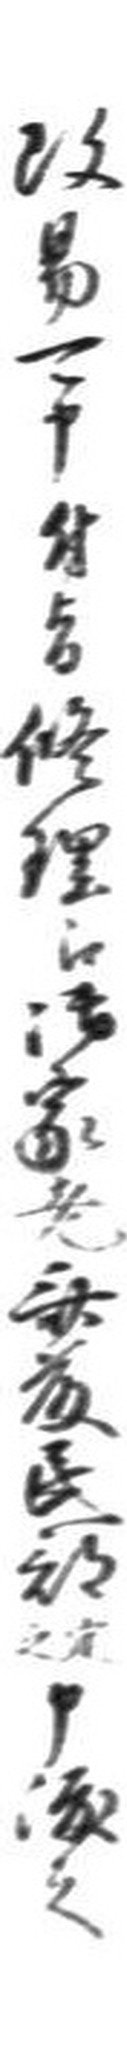改易可申付旨修理江御家老斎藤民部定之申渡之
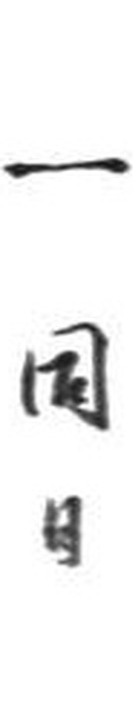一同日
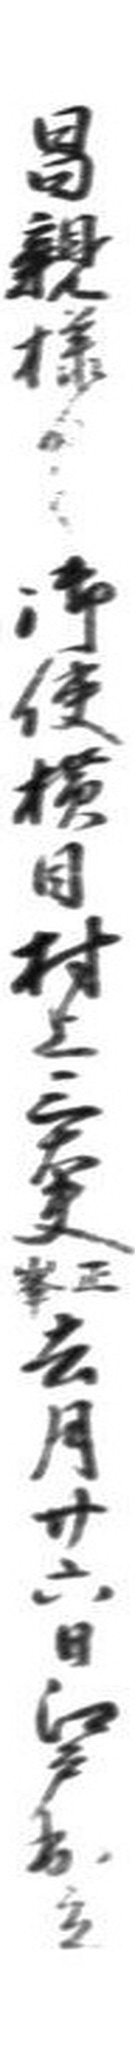昌親様ゟ之御使横目村上三大夫正峯去月廿六日江戸出立
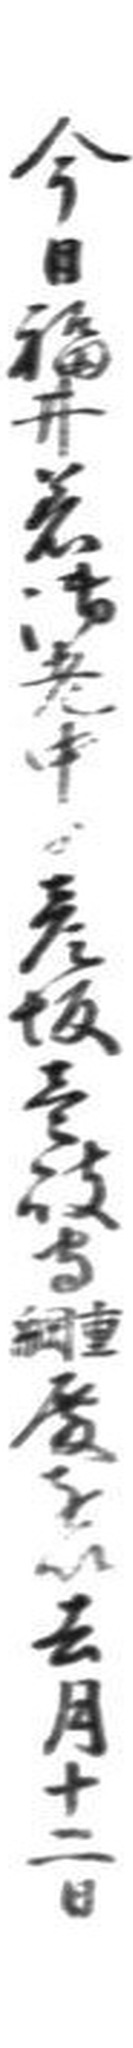今日福井着御老中ゟ彦坂壱岐守重綱殿を以去月十二日
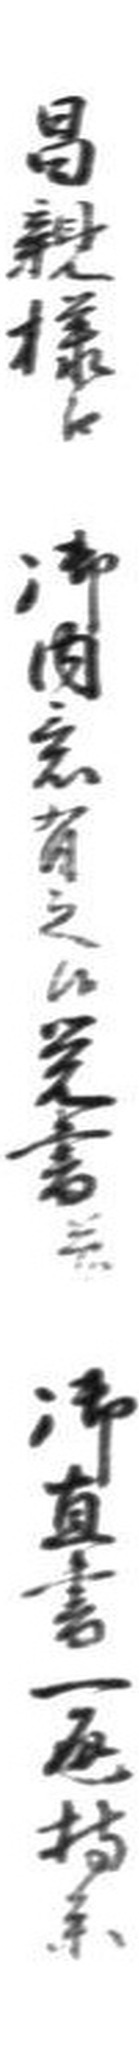昌親様江御内意有之候覚書并御直書一通持参

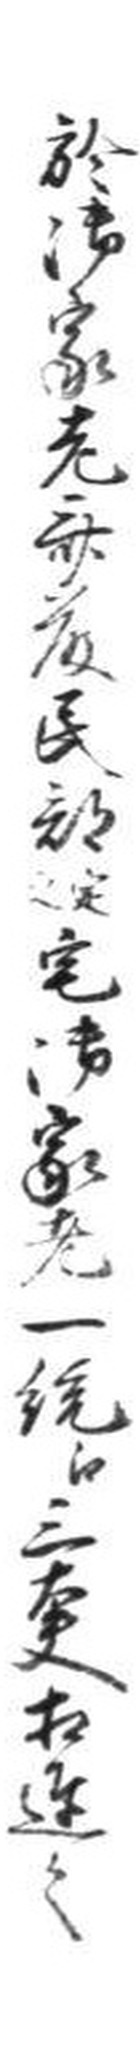於御家老斎藤民部定之宅御家老一統江三大夫相達之
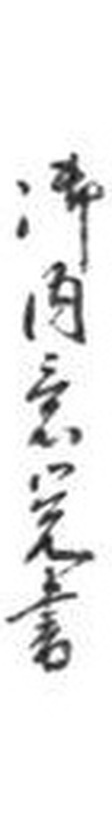御内意覚書
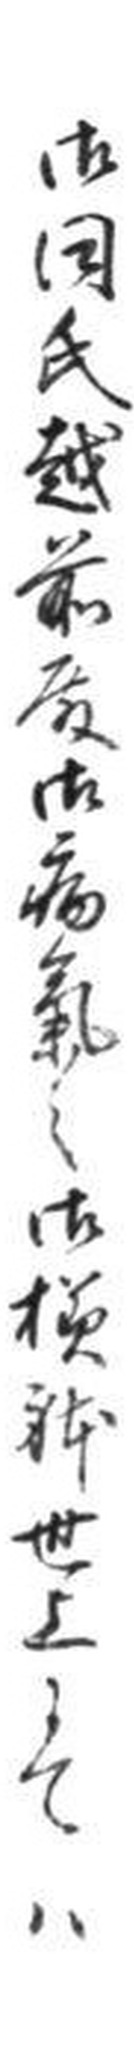御同氏越前殿御病気之御様躰世上にてハ
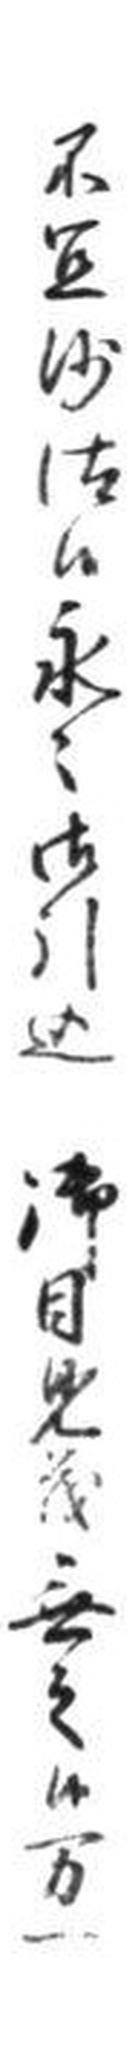不宜沙汰候永々御引込御目見も無之候万一
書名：家譜 十五 綱昌公 従天和元年到元禄十二年
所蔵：福井県文書館 Fukui Prefectural Archives
